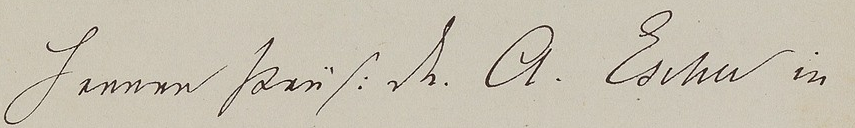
Herren Präs. Dr. A. Escher in
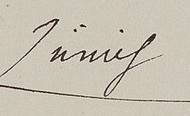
Zürich
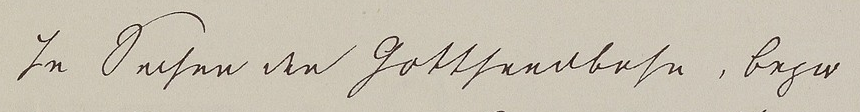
In Sachen der Gotthardbahn, bezw
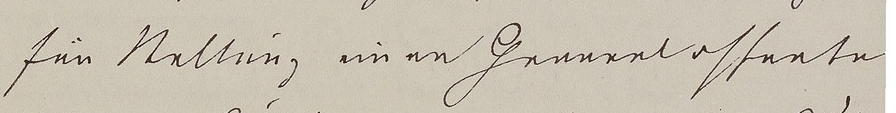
für Stellung einer Generalofferte
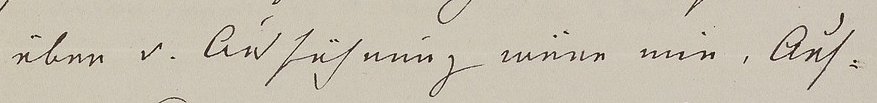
über d. Ausführung wäre mir, Auf-
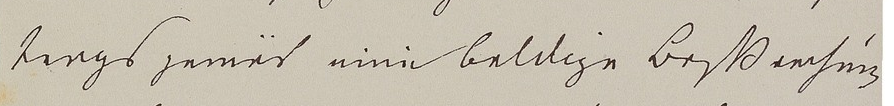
trags gemäs eine baldige Besprechung
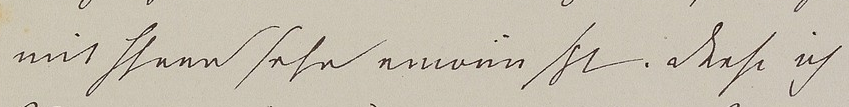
mit Ihnen sehr erwünscht. Darf ich
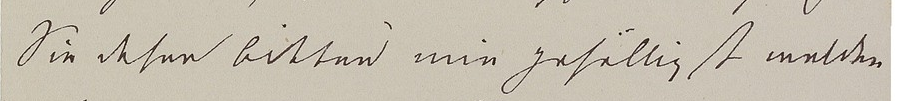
Sie daher bitten mir gefälligst melden
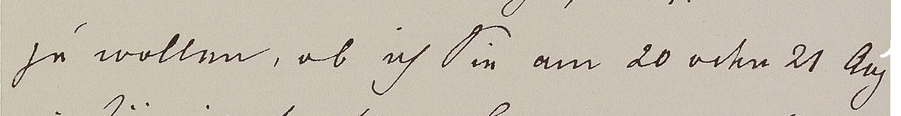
zu wollen, ob ich Sie am 20 oder 21 Aug
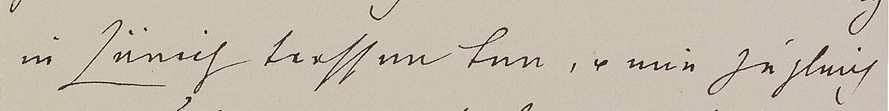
in Zürich treffen kan, & mir zugleich
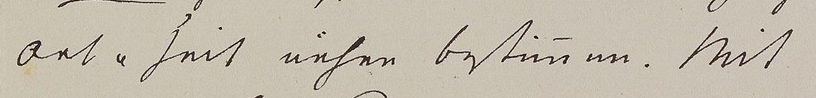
Ort & Zeit näher bestimmen. Mit
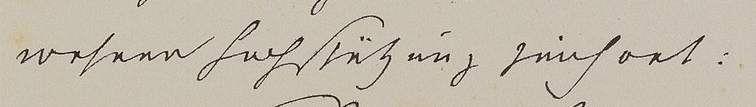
wahrer Hochschätzung zeichnet:
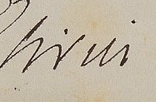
Zschokke.
